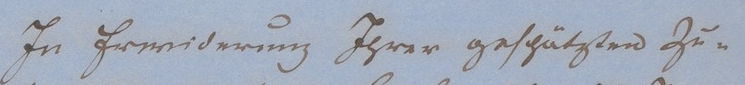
In Erwiderung Ihrer geschätzten Zu-
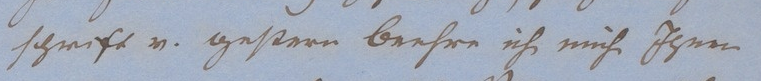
schrift v. gestern beehre ich mich Ihnen
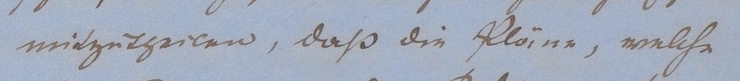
mitzutheilen, daß die Pläne, welche
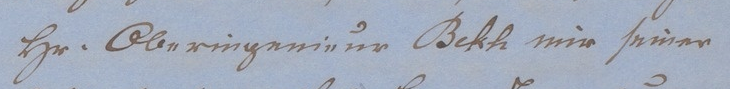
Hr. Oberingenieur Bekh mir seiner
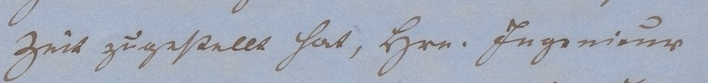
Zeit zugestellt hat, Hrn. Ingenieur
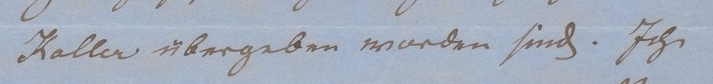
Koller übergeben worden sind. Ich
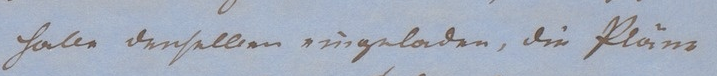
habe denselben eingeladen, die Pläne
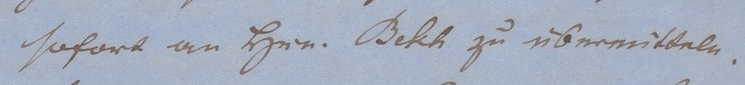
sofort an Hrn. Bekh zu übermitteln.
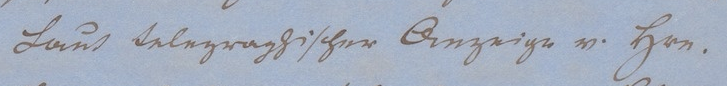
Laut telegraphischer Anzeige v. Hrn.
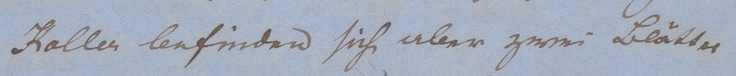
Koller befinden sich aber zwei Blätter
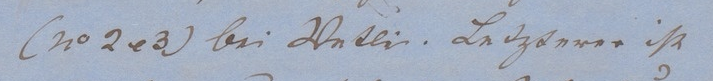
(No 2 & 3) bei Wetli. Letzterer ist
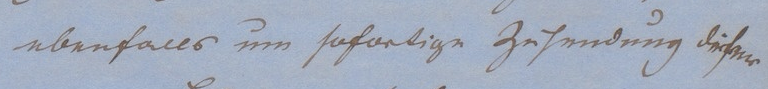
ebenfalls um sofortige Zusendung dieser
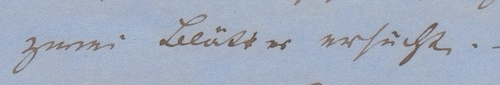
zwei Blätter ersucht. –
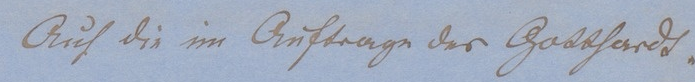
Auch die im Auftrage des Gotthardt -
